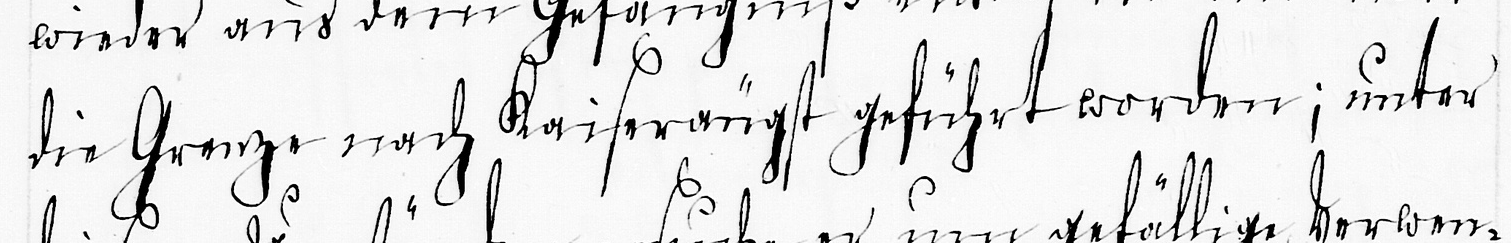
die Grenze nach Kaiseraugst geführt worden; unter
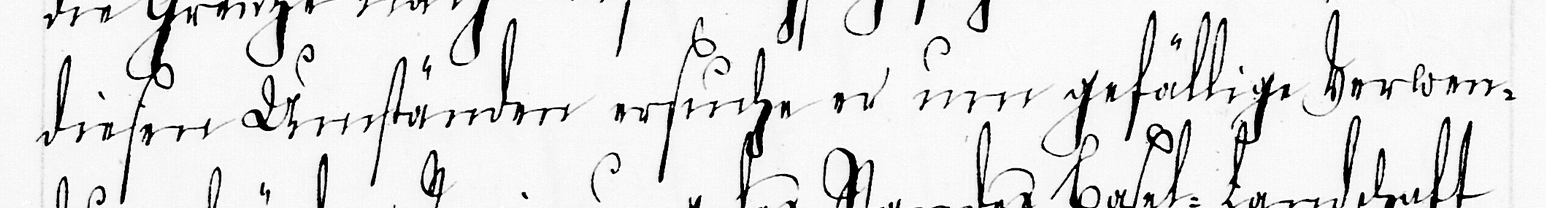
diesen Umständen ersuche er um gefällige Verwen¬
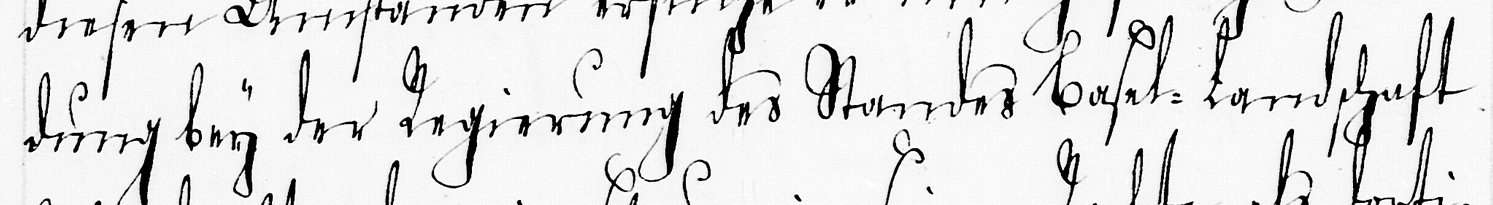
dung bey der Regierung des Standes Basel-Landschaft
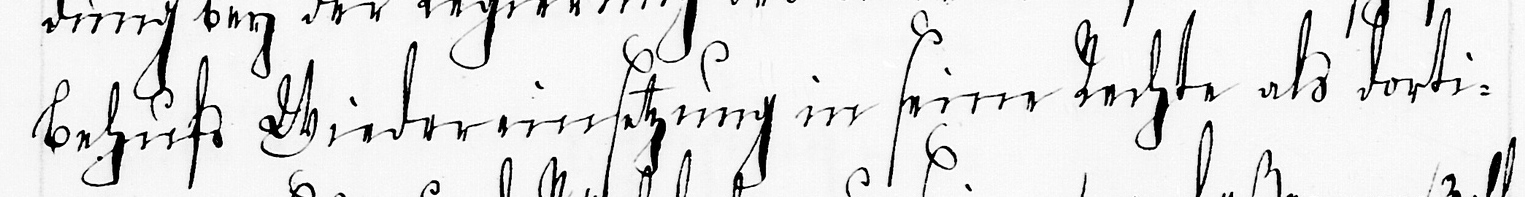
behufs Wiedereinsetzung in seine Rechte als dorti¬
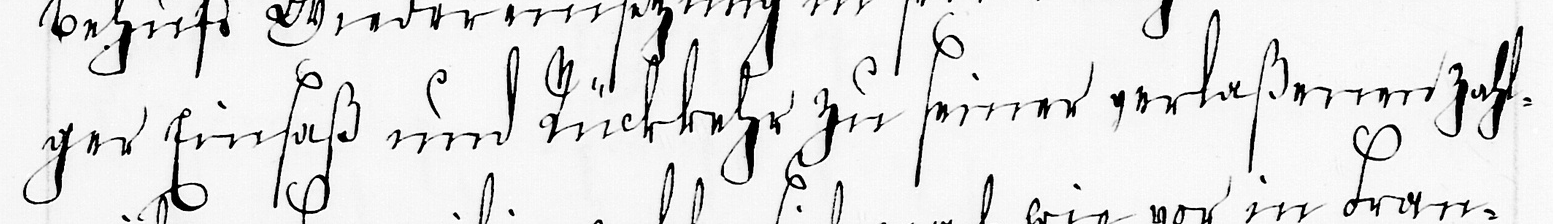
ger Einsaß und Rückkehr zu seiner verlaßenen zahl¬
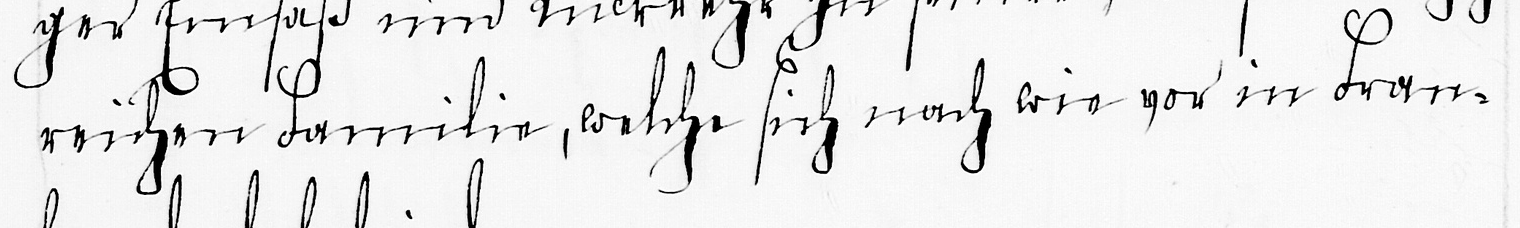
reichen Familie, welche sich nach wie vor in Fran¬
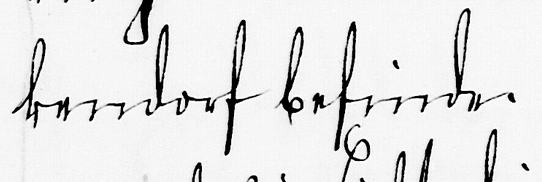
kendorf befinde.
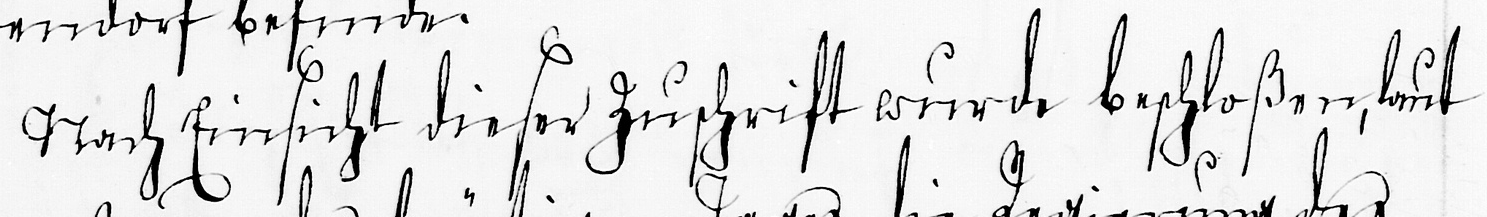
Nach Einsicht dieser Zuschrift wurde beschloßen, laut
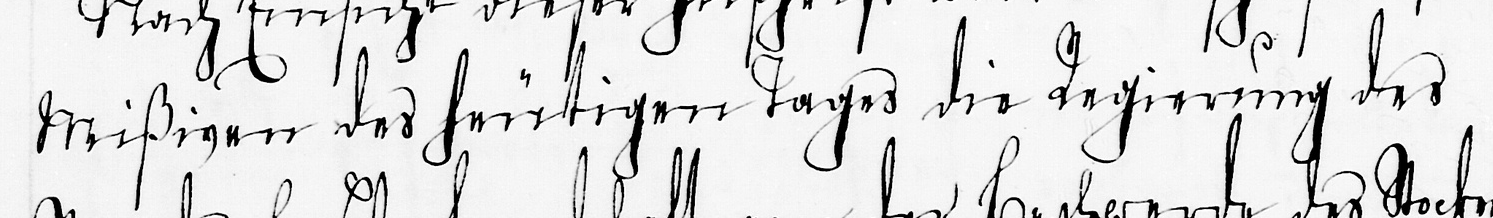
Mißiven des heutigen Tages die Regierung des
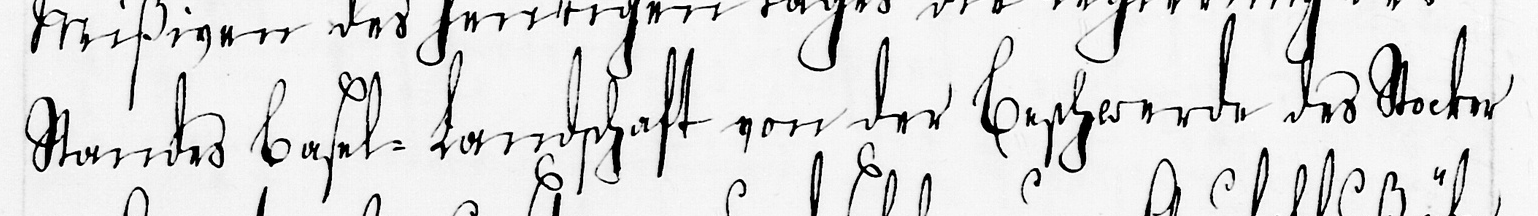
Standes Basel-Landschaft von der Beschwerde des Stocker
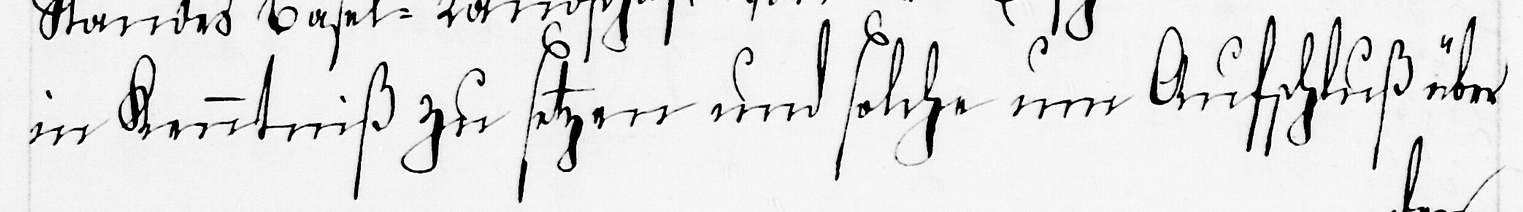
in Kenntniß zu setzen und solche um Aufschluß über
